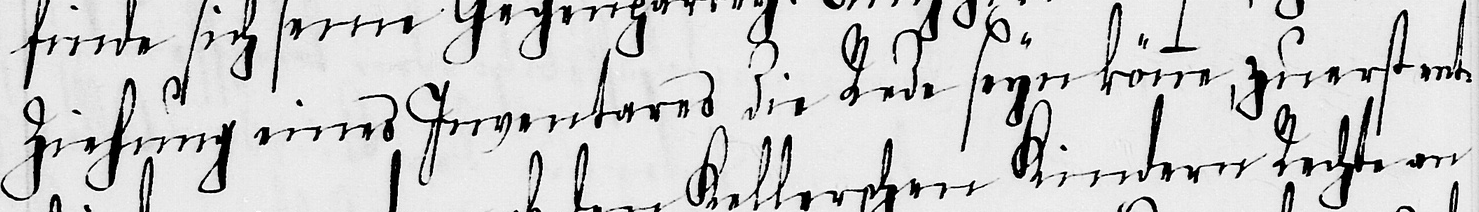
Ziehung eines Inventares die Rede seyn könne, zuerst en¬
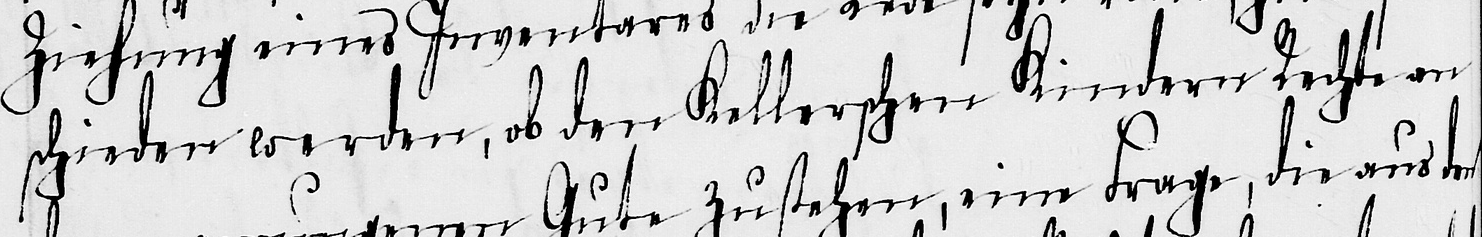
schieden werden, ob den Kellerschen Kindern Rechte an
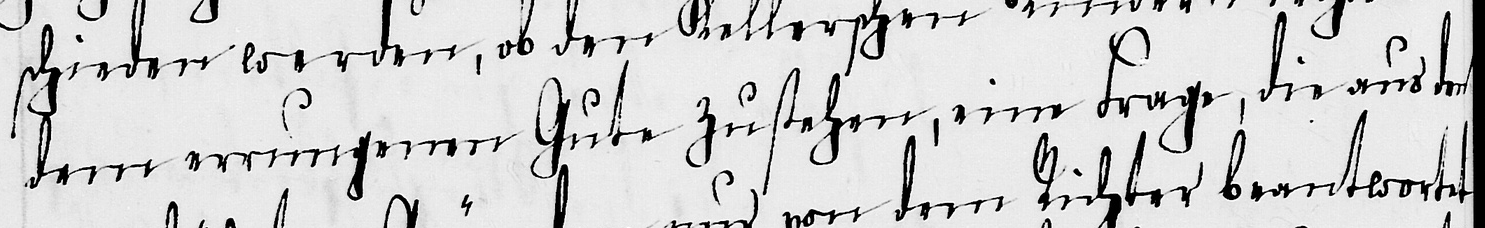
dem errungenen Gute zustehen, eine Frage, die aus den
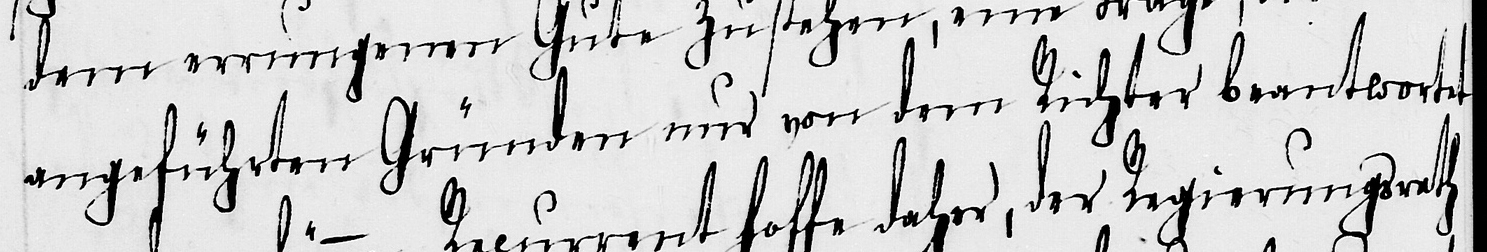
angeführten Gründen nur von dem Richter beantwortet
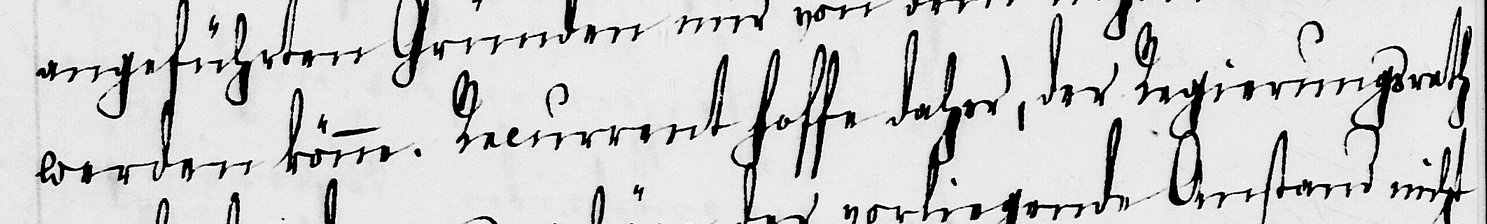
werden könne. Recurrent hoffe daher, der Regierungsrath
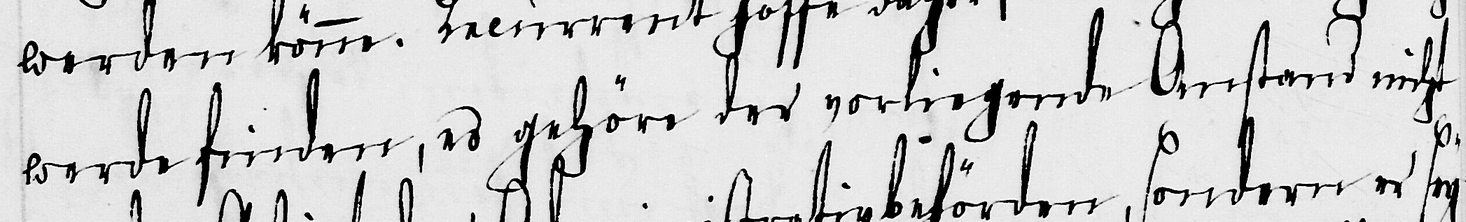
werde finden, es gehöre der vorliegende Anstand nicht
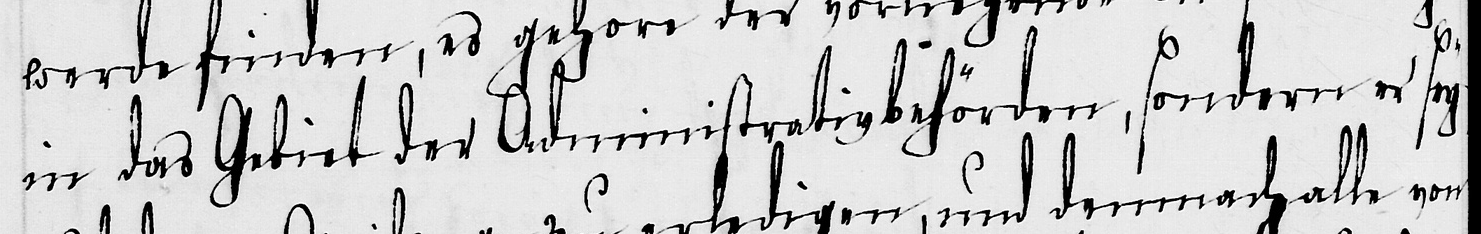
in das Gebiet der Administrativbehörden, sondern es sey
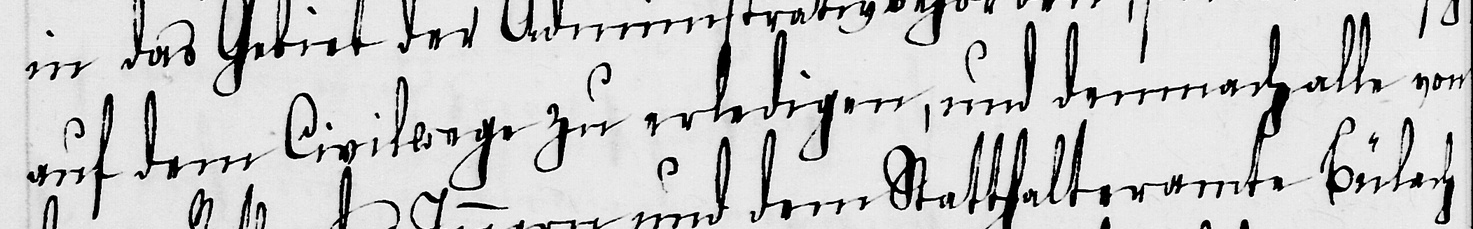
auf dem Civilwege zu erledigen, und demnach alle
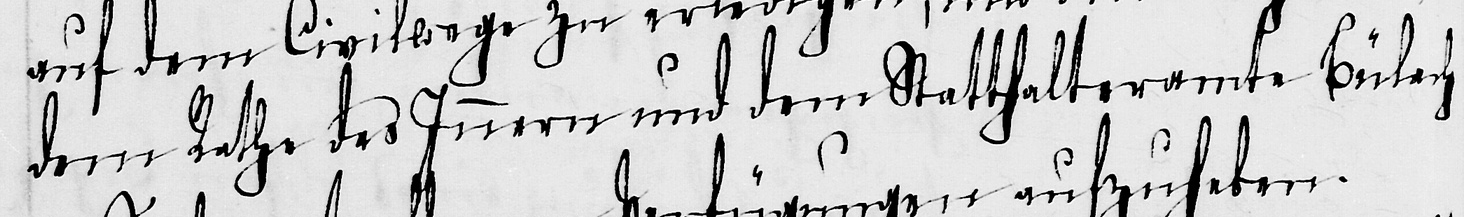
dem Rathe des Innern und dem Statthalteramte Bülach
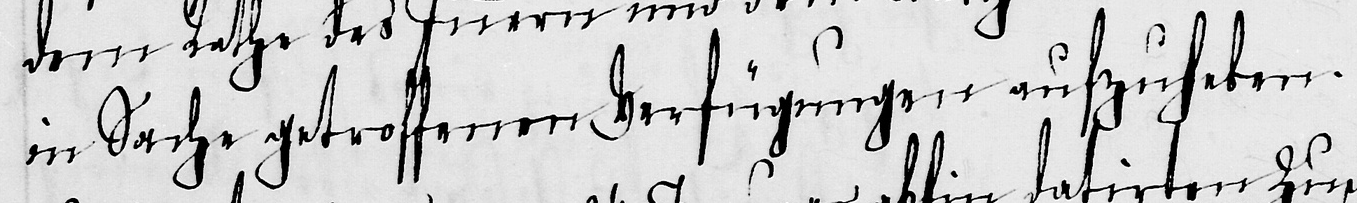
in Sache getroffenen Verfügungen aufzuheben.
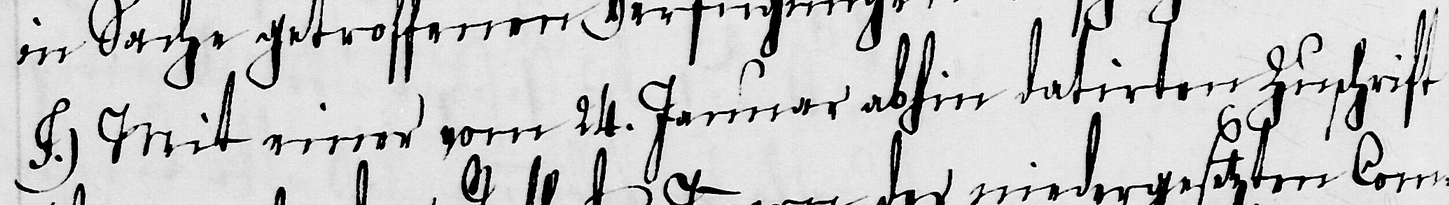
F.) Mit einer vom 24. Januar abhin datirten Zuschrift
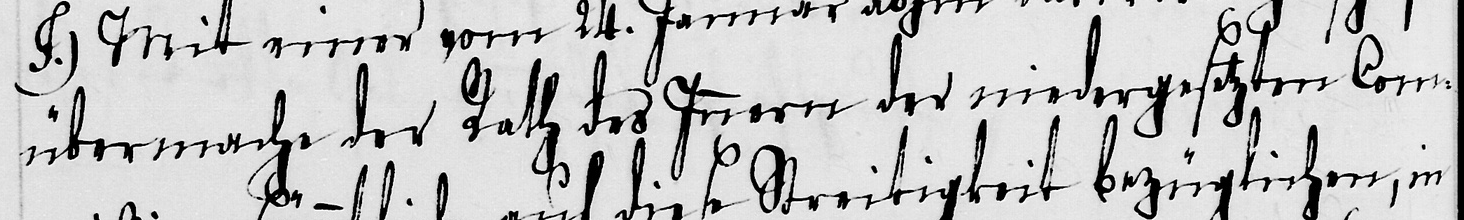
übermache der Rath des Innern der niedergesetzten Com¬
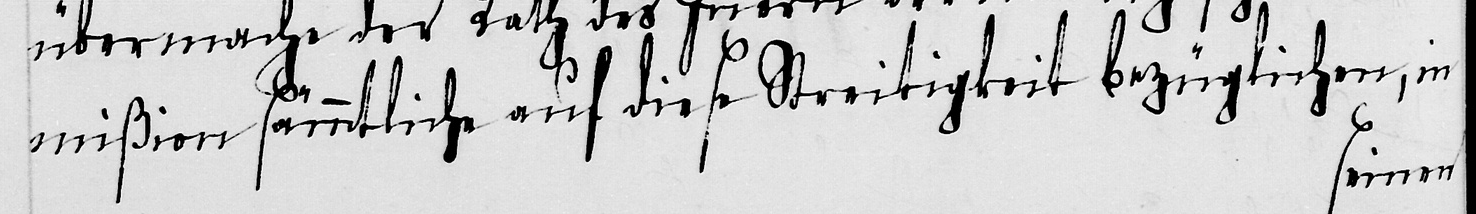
mißion sämmtliche auf diese Streitigkeit bezüglichen, in
